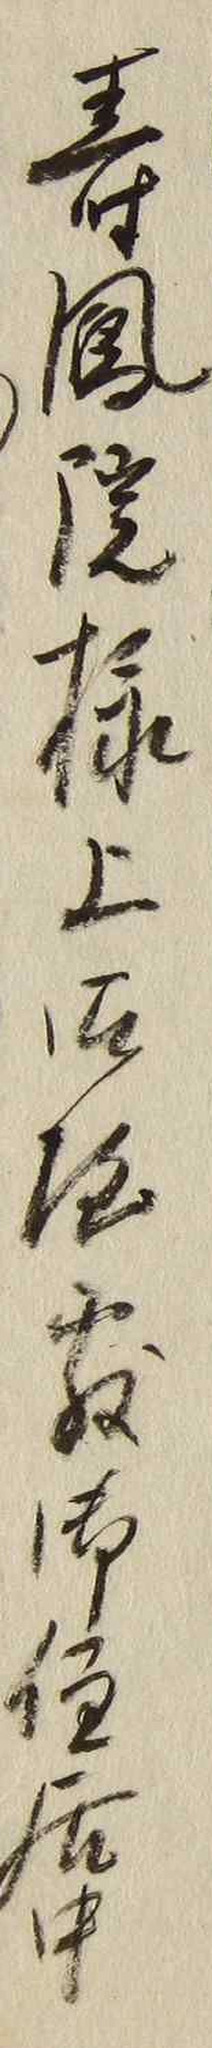寿鳳院様上御屋敷御住居中
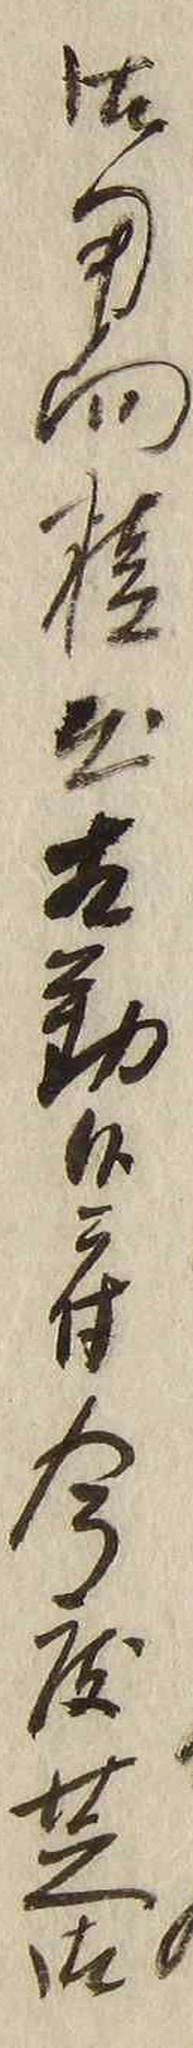御用向精出相勤候ニ付今度芝御

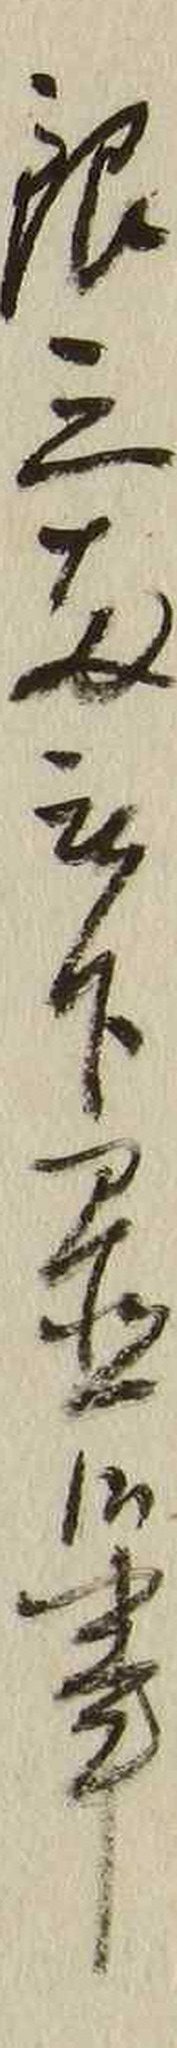銀三両被下置候事
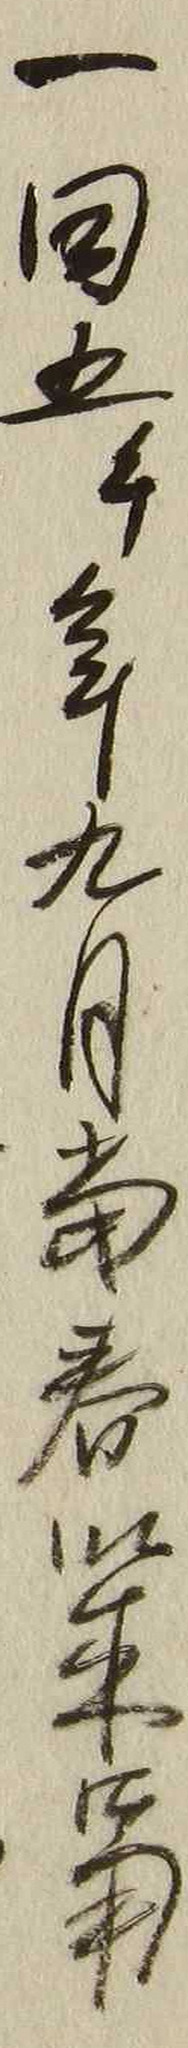一同五午年九月当春以来御用
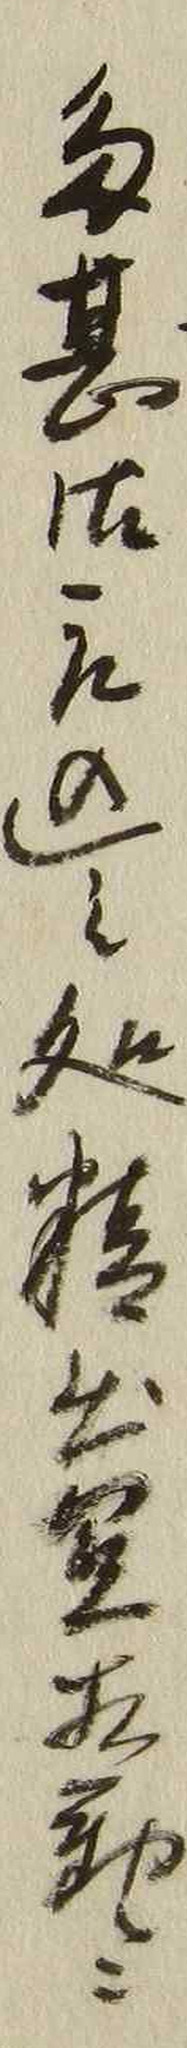多甚御取込之処精出宜相勤候ニ
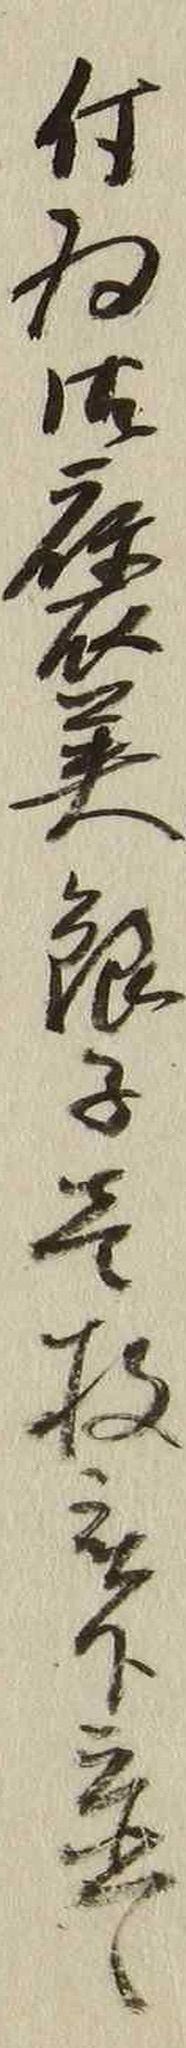付為御褒美銀子壱枚被下置候
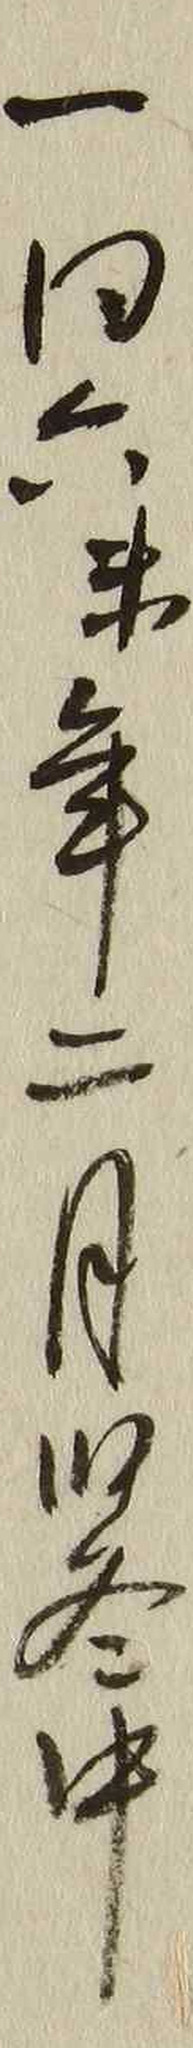一同六未年二月旧冬中
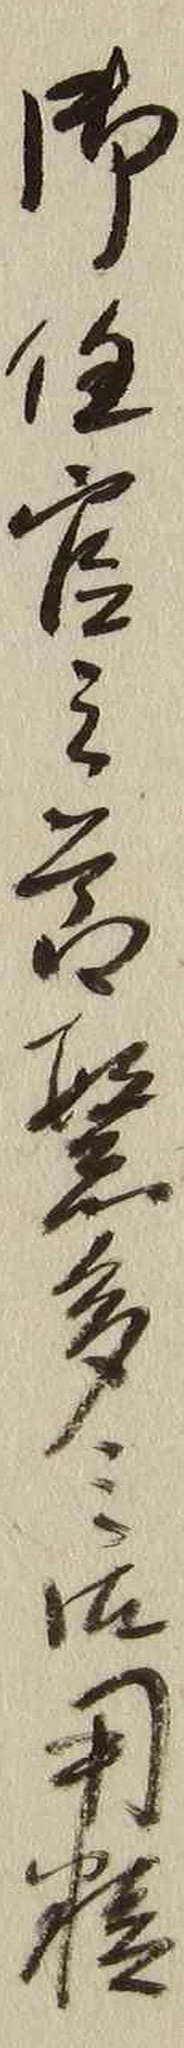御任官之節繁多之御用精
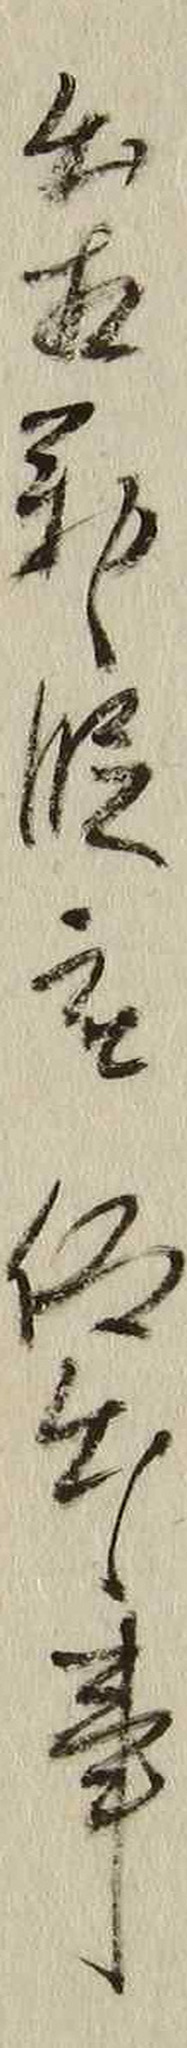出相勤候段被仰出候事
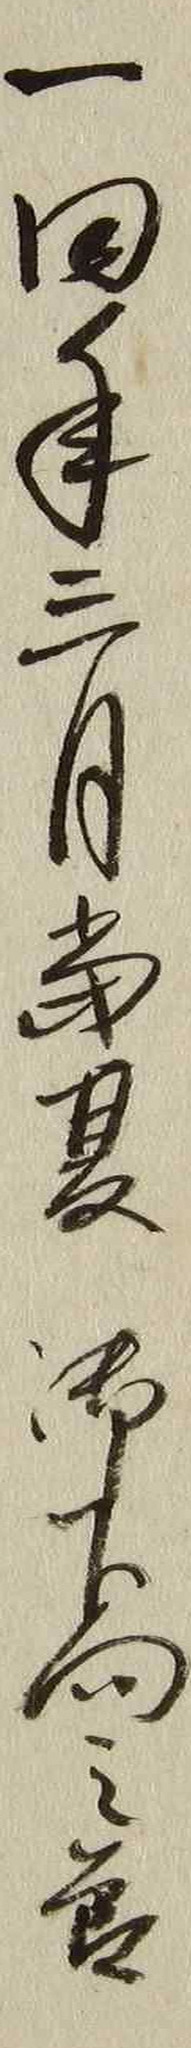一同年三月当夏御下向之節
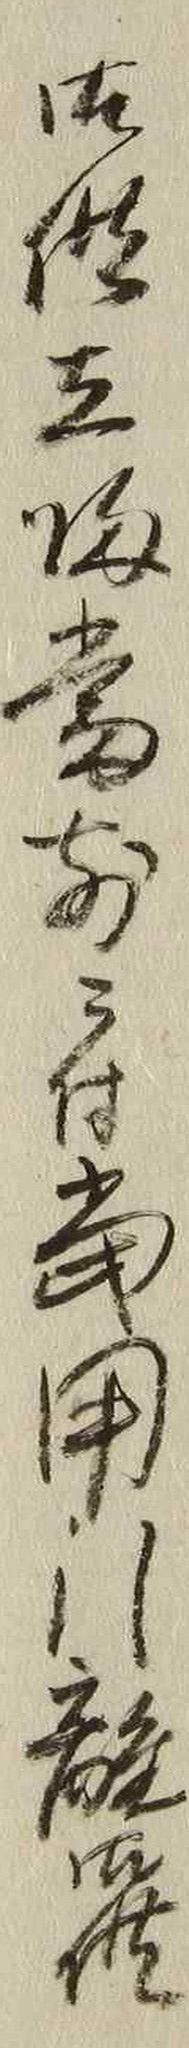御供立帰当前ニ付当用引離御供
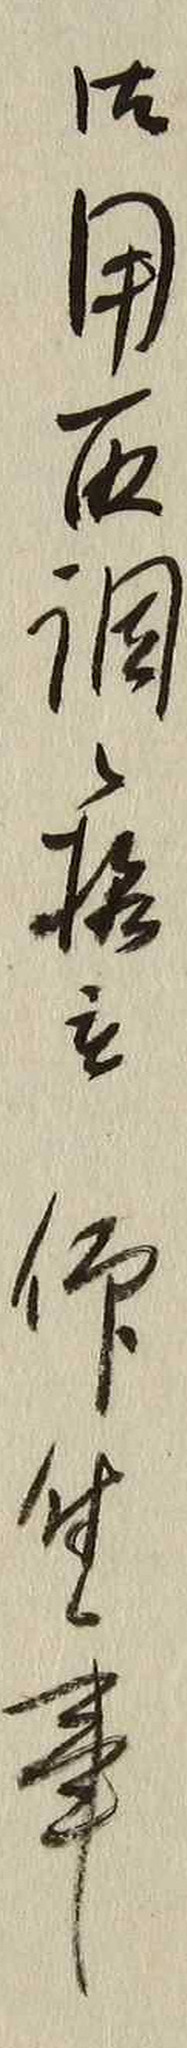御用取調候様被仰付候事
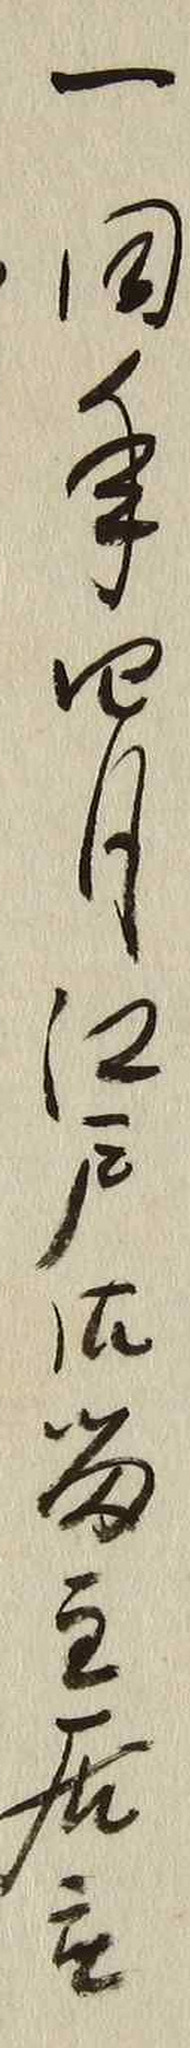一同年四月江戸御留主居被
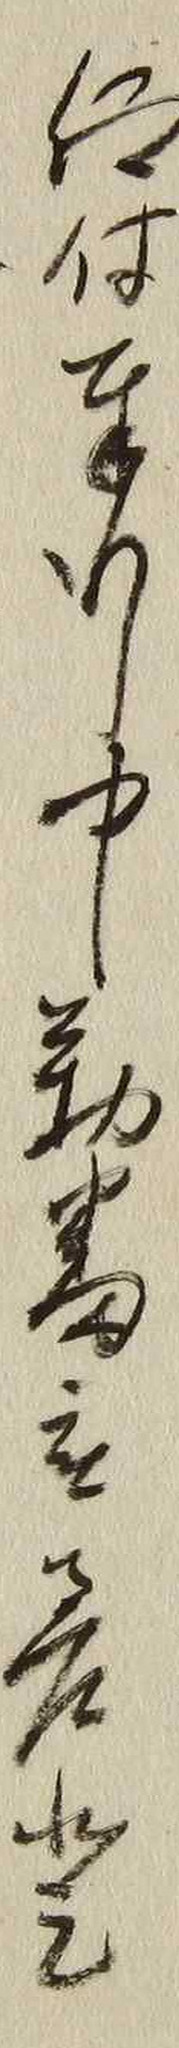仰付奉行中勤番被差登
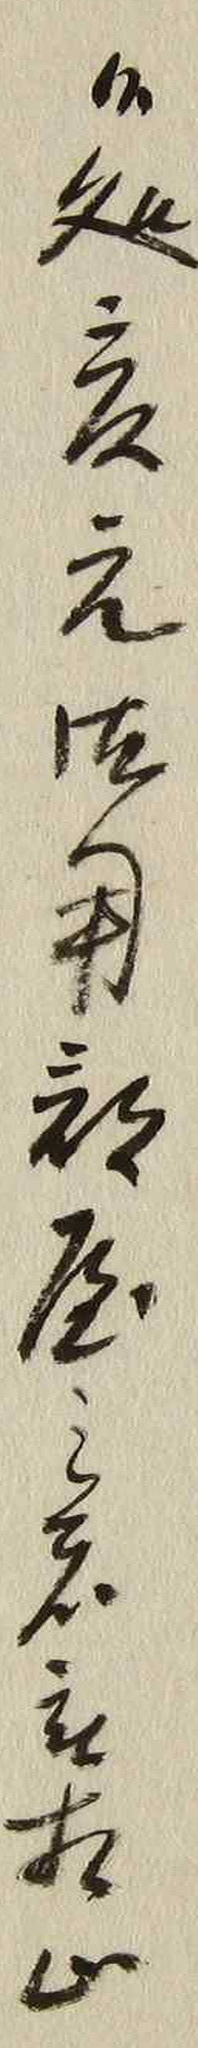候処爰元御用部屋之者被相止
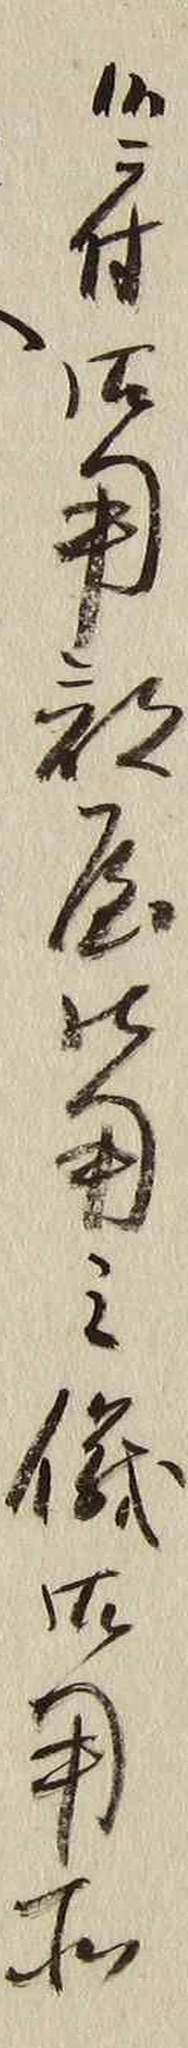候ニ付御用部屋御用之儀御用所
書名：諸士系譜　巻之353　す之部3
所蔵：会津若松市立会津図書館
